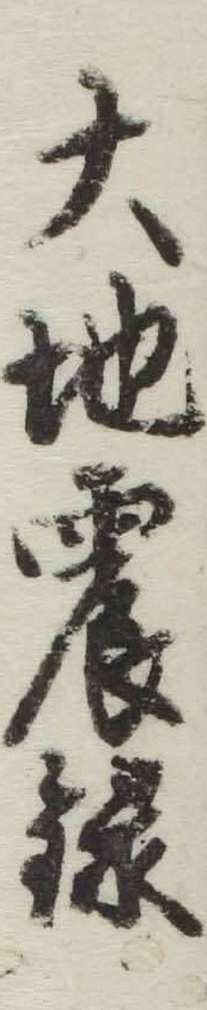大地震録
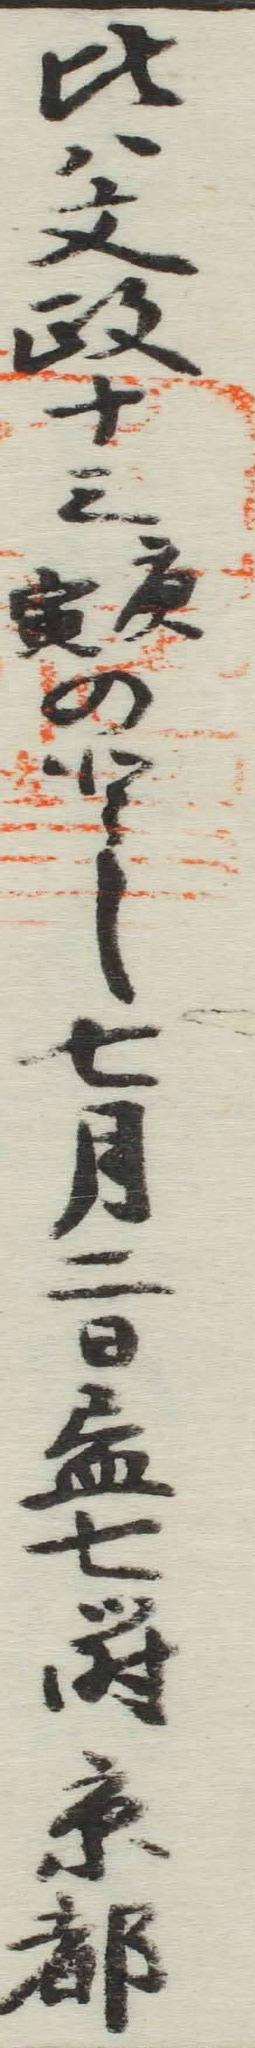比は文政十三庚寅のとし七月二日昼七ツ時京都
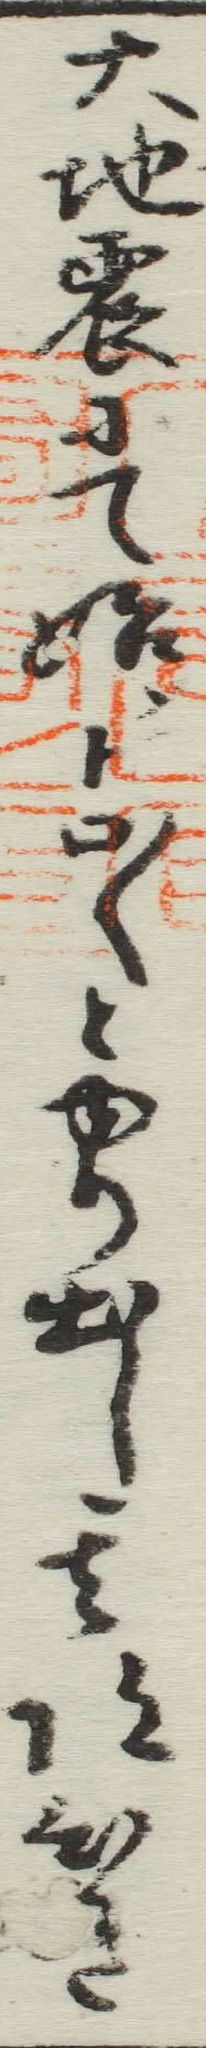大地震にて始メトロ〳〵とゆり出し其後ひき
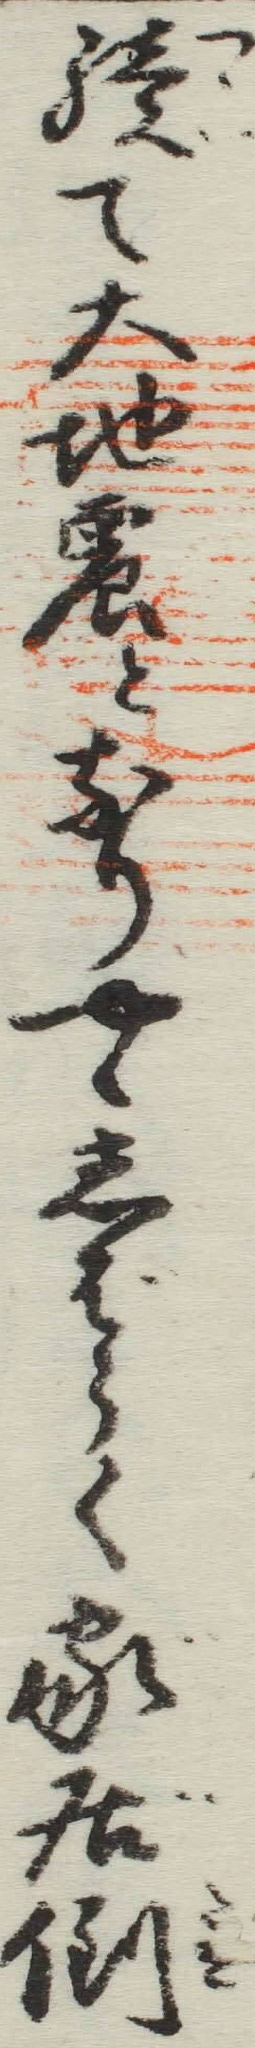続て大地震となりやゝしばらく家居倒
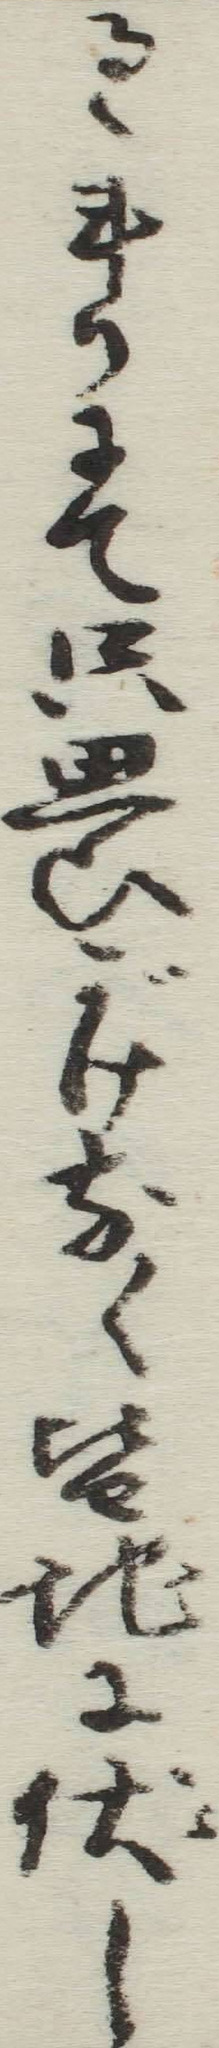るゝ斗りにて只思ひがけなく皆地に伏し
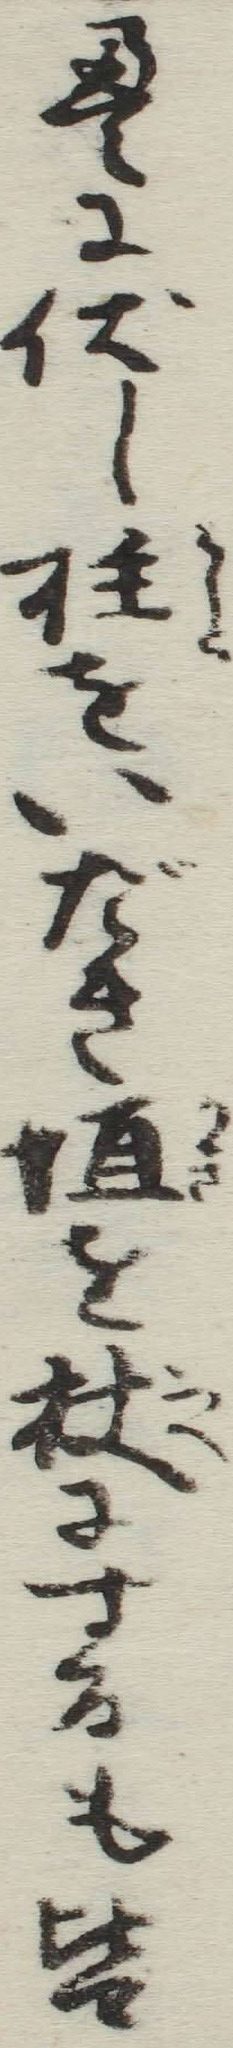畳に伏し柱をいだき垣を杖にするも皆
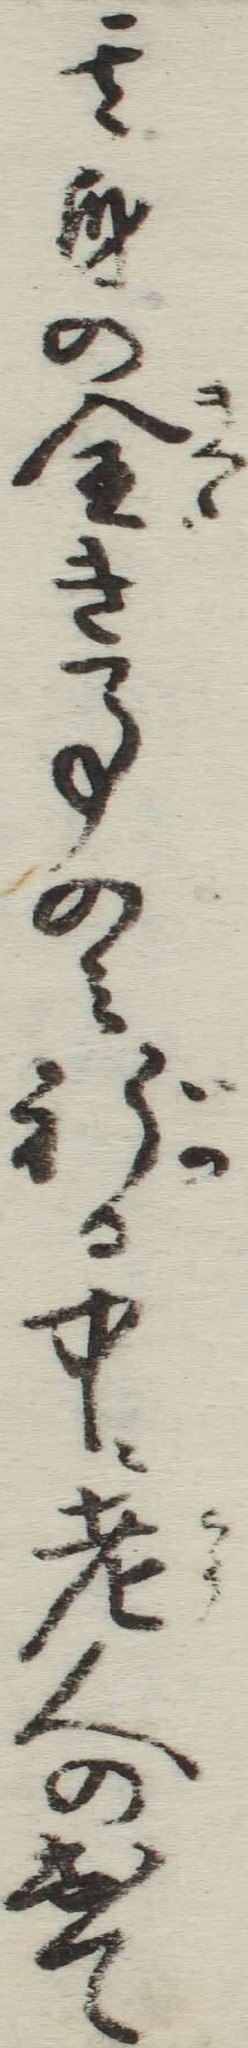其身の全き事のみ祈る中に老人の出て
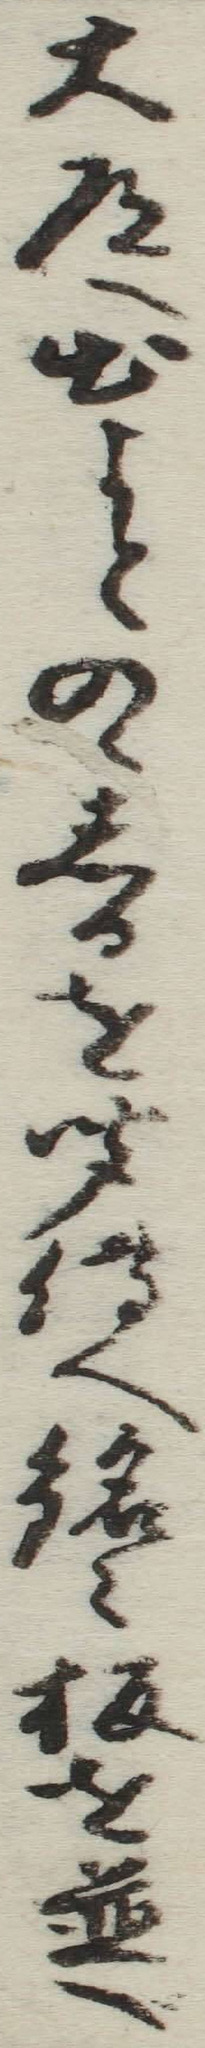大道へ出よとのゝしるを聞伝へ銘々板を並べ

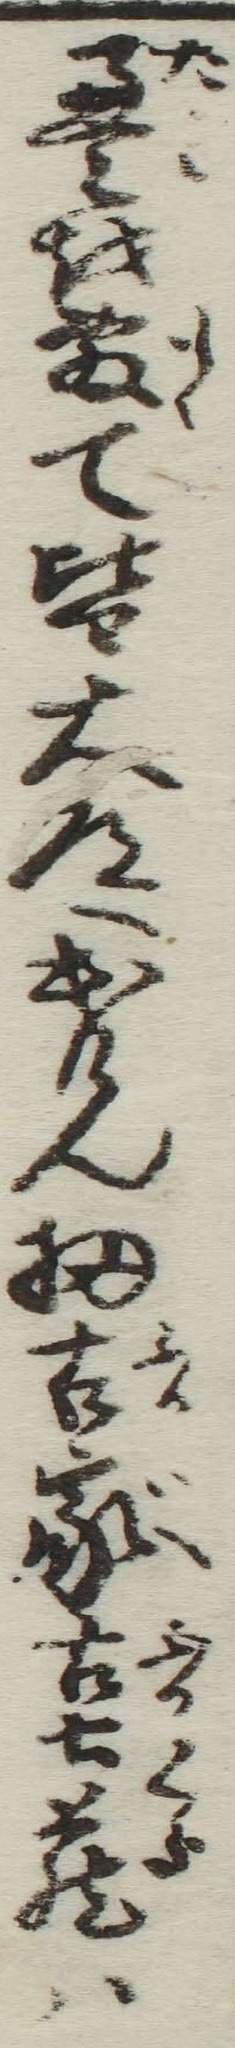畳を敷て皆大道へ出けん扨古家古土蔵は
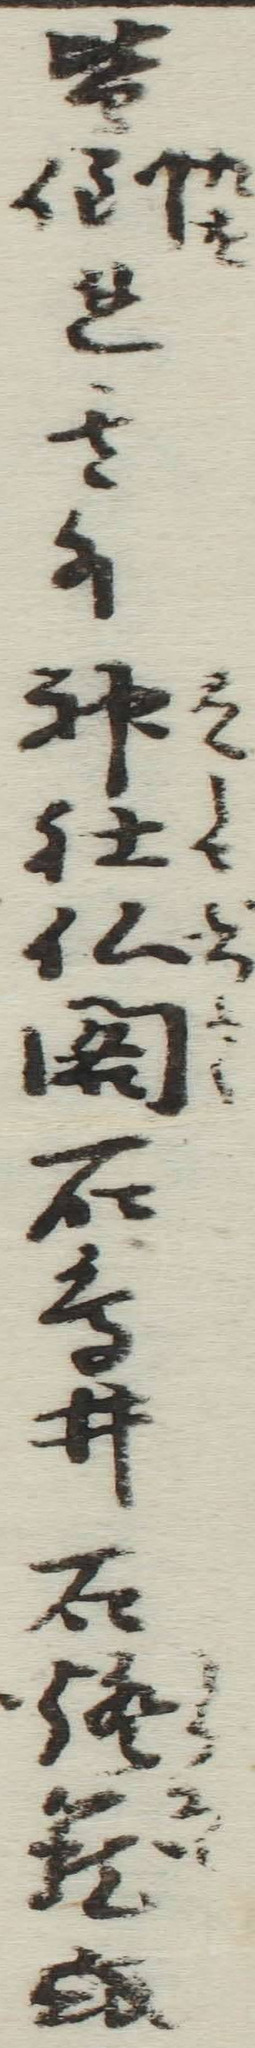皆倒れ其外神社仏閣石鳥井石燈籠或
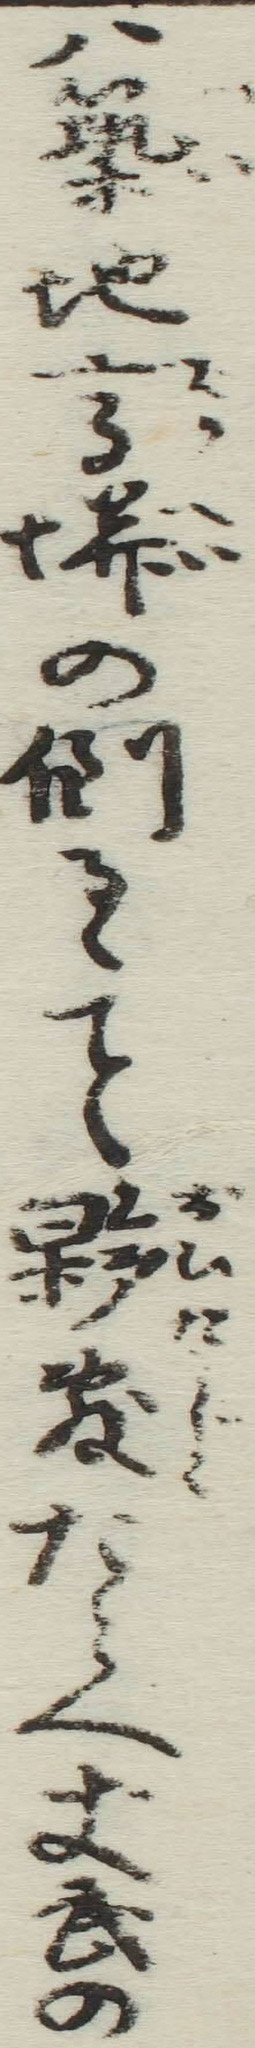は築地高塀の倒るゝこと夥敷たとへ丈武の
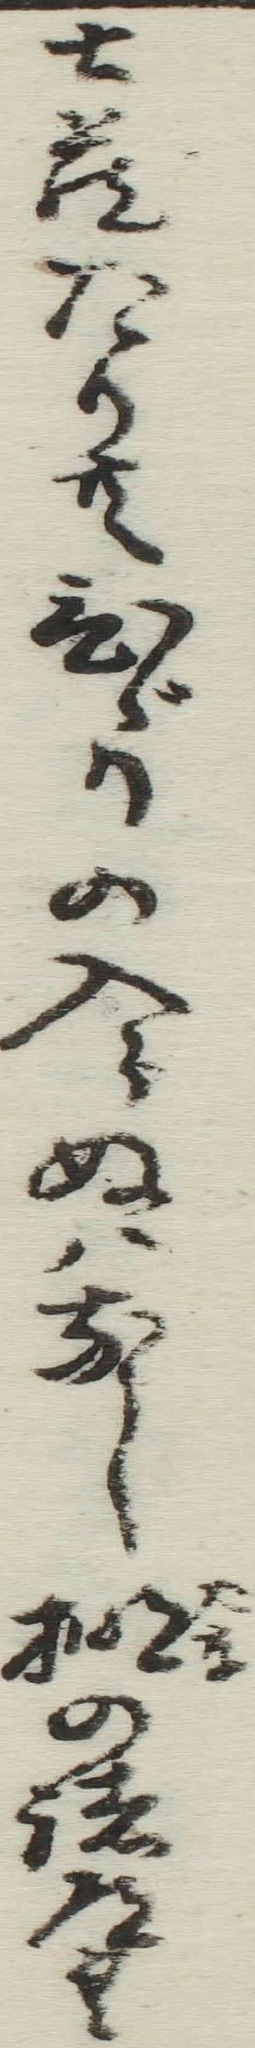土蔵たり共ひゞりの入らぬはなし棚の諸道具
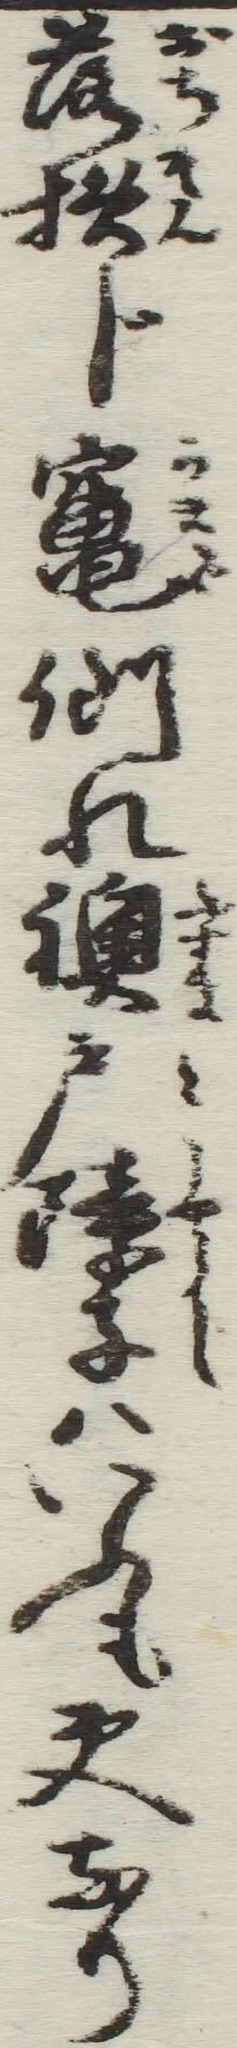落損じ竃倒れ襖戸障子はいふも更なり
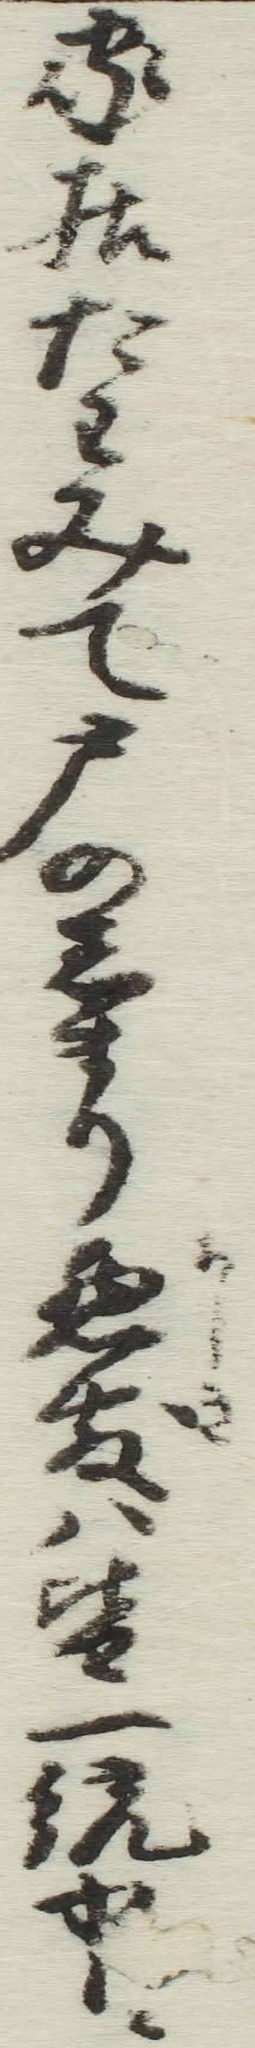家居たわみて戸のしまり悪敷は皆一統中に
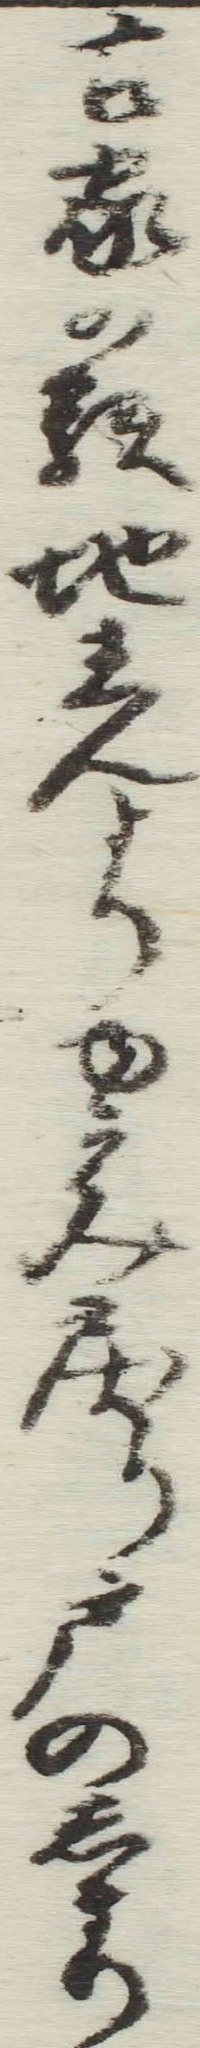古家の類地しんよりゆかみ戻り戸のしまり
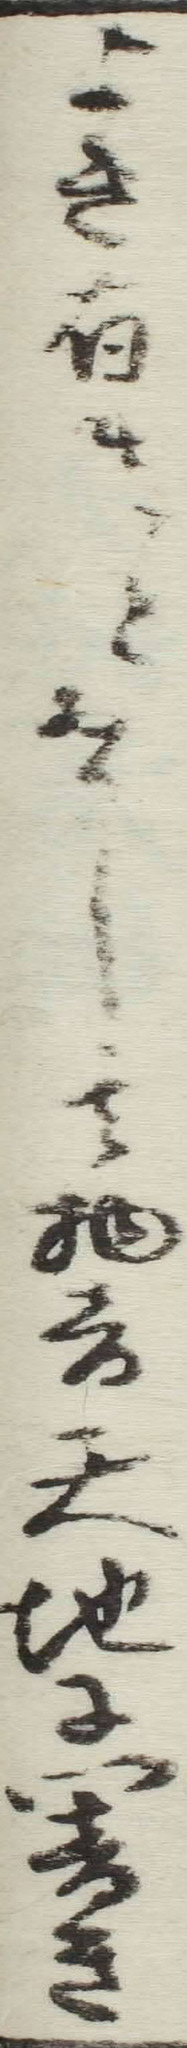よき有もいとおかし其物音天地に響き
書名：地震奇談／平安万歳楽
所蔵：国文学研究資料館
